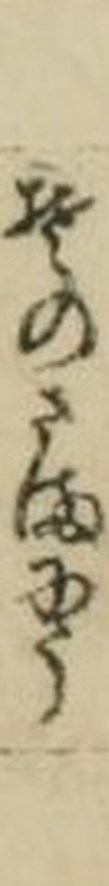そのさまにう
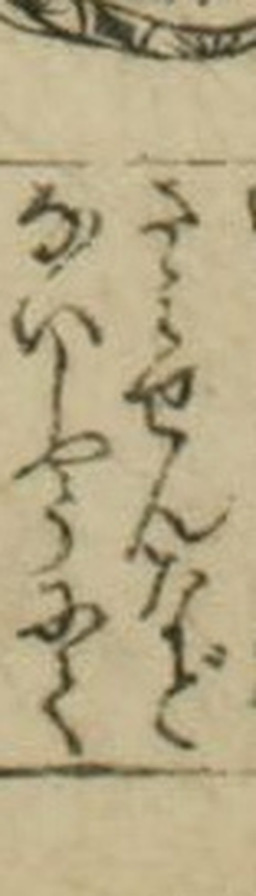ないしやうにて
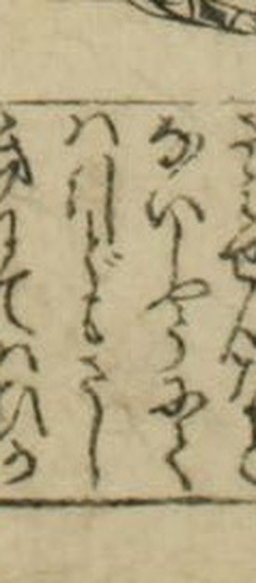は引どもさし
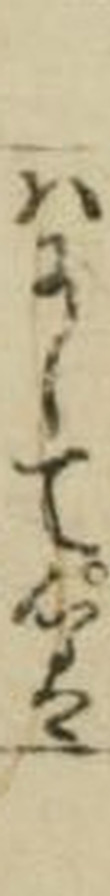はにして。心は
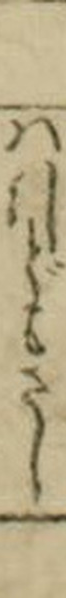は引どもさし
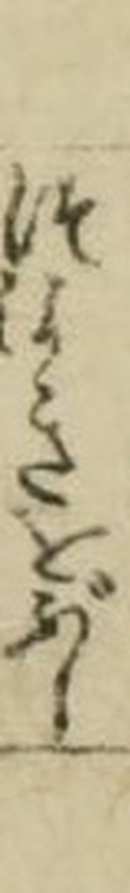つよきをぶし
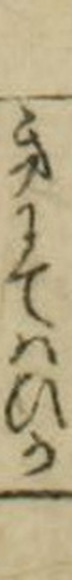きにてはひか
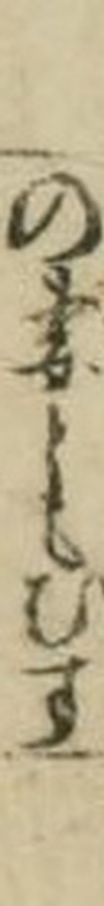の妻ともむす
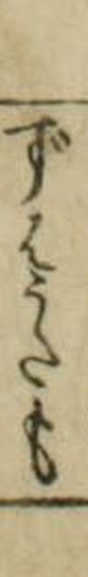ずはうたも
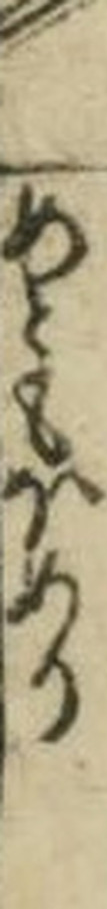めともほめり
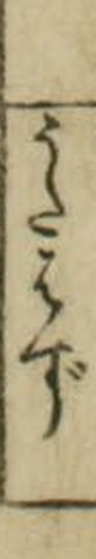うたはず
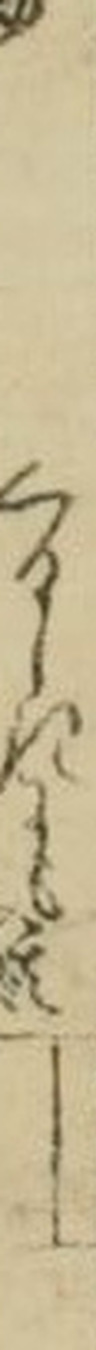くるしきにも其
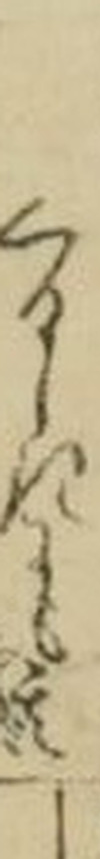くるしきにも其
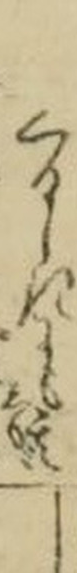くるしきにも其
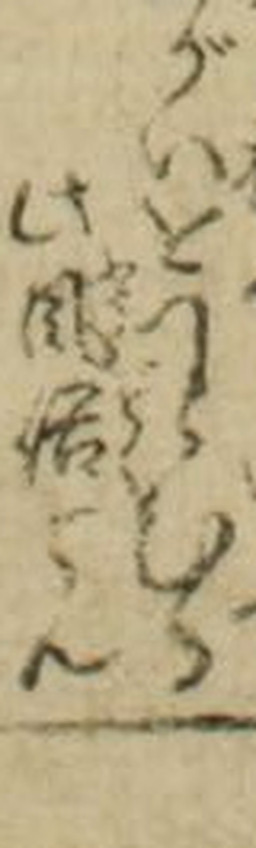此風俗てん
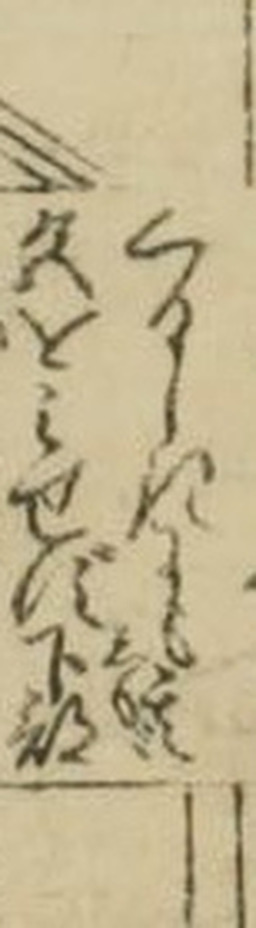色をみせず下部
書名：女源氏教訓鑑
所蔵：東京学芸大学附属図書館
